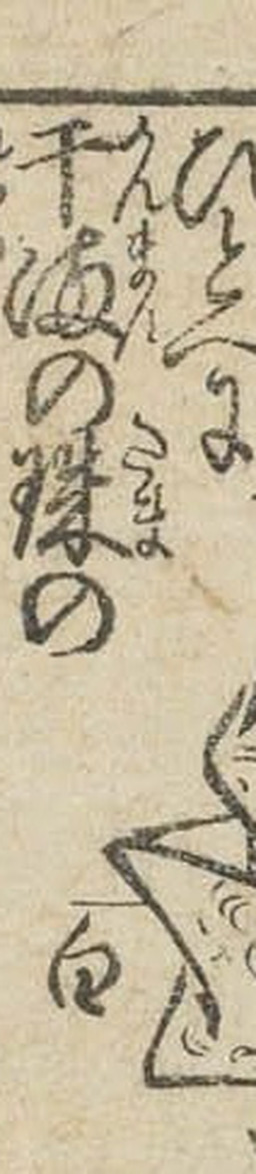干満の珠の白
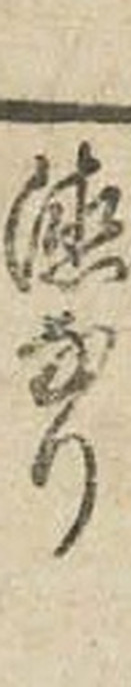徳なり
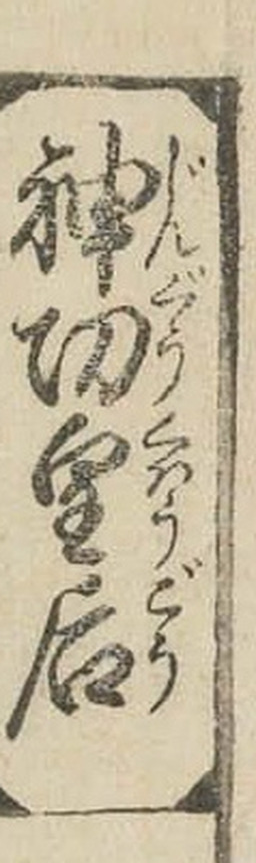神功皇后
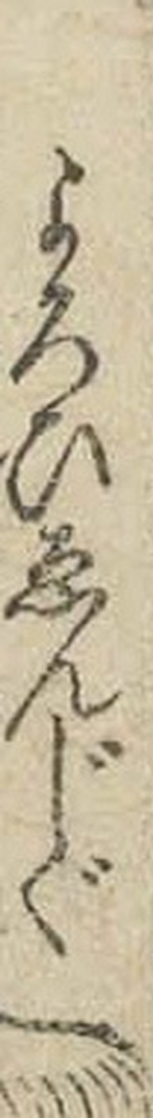よろひゑんじぐ
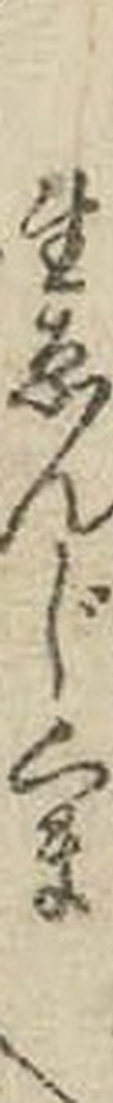生ゑんじくま
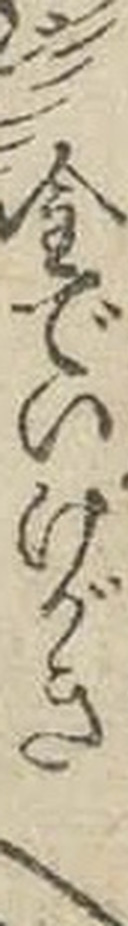金でいけがき
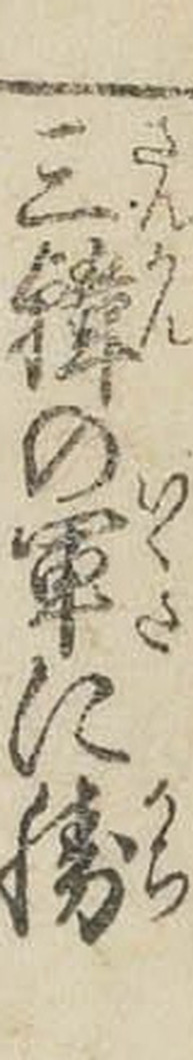三韓の軍に勝
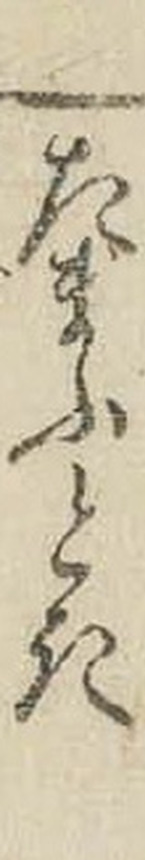たまふとき
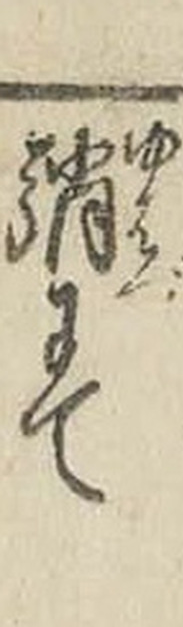弰にて
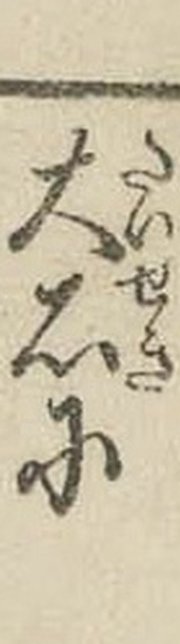大石に
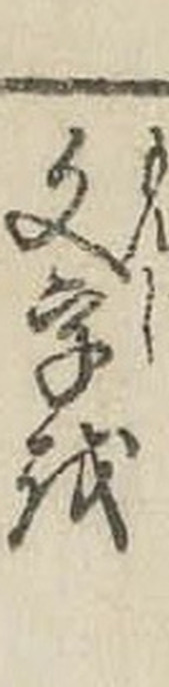文字を
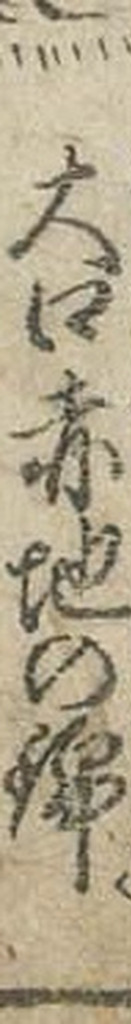大口赤地の錦
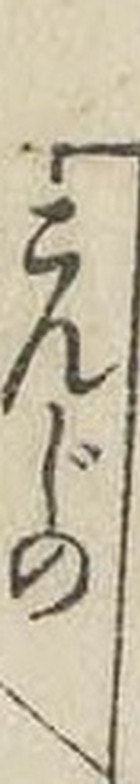こんじの
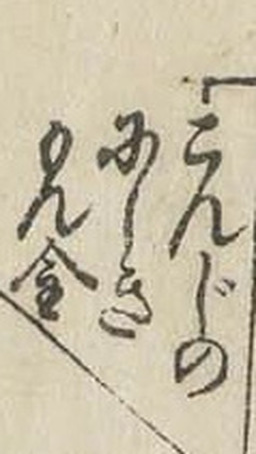にしき
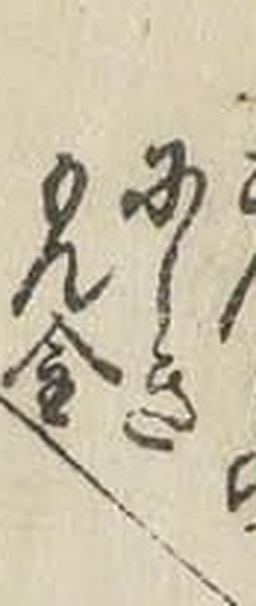もん金

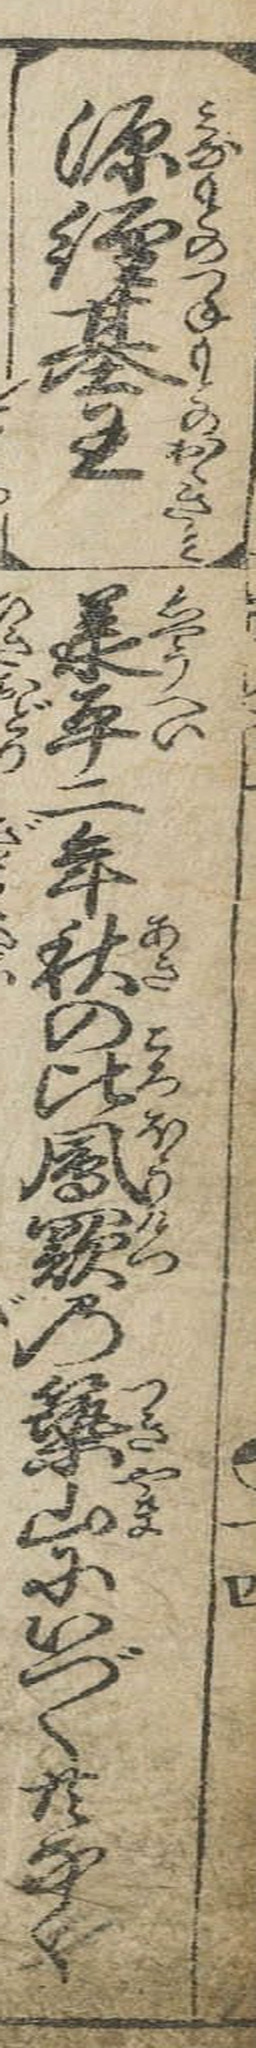源経基王承平二年秋の比鳳闕の築山にいづく共なく
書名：絵本写宝袋 9巻 2之巻
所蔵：東京学芸大学教育コンテンツアーカイブ
